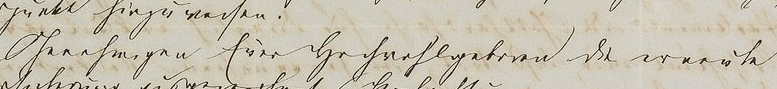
Genehmigen Euer Hochwohlgeboren die erneute
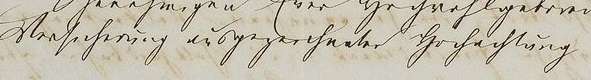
Versicherung ausgezeichneter Hochachtung
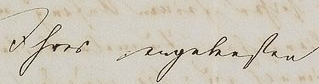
Ihres ergebensten
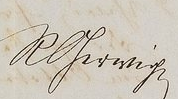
R Gerwig
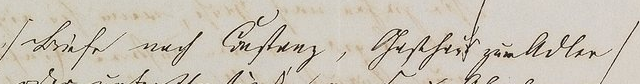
(Briefe nach Constanz, Gasthaus zum Adler
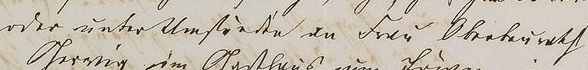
oder unter Umständen an Frau Oberbaurath
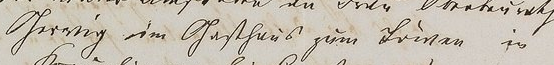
Gerwig im Gasthaus zum Löwen in
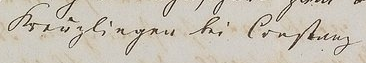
Kreuzlingen bei Constanz.)
